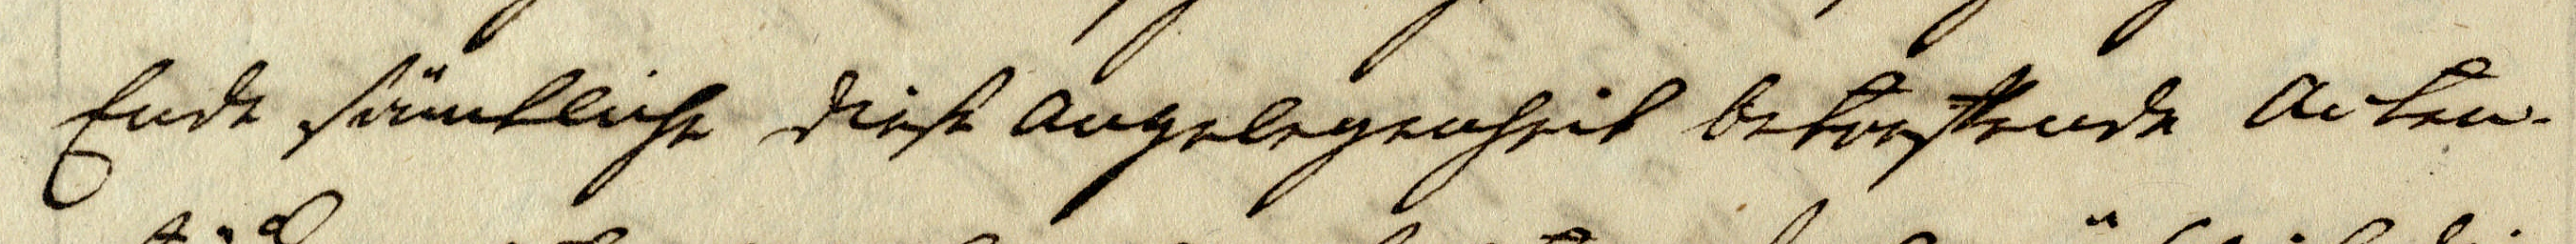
Ende sämtliche diese Angelegenheit betreffende Acten¬
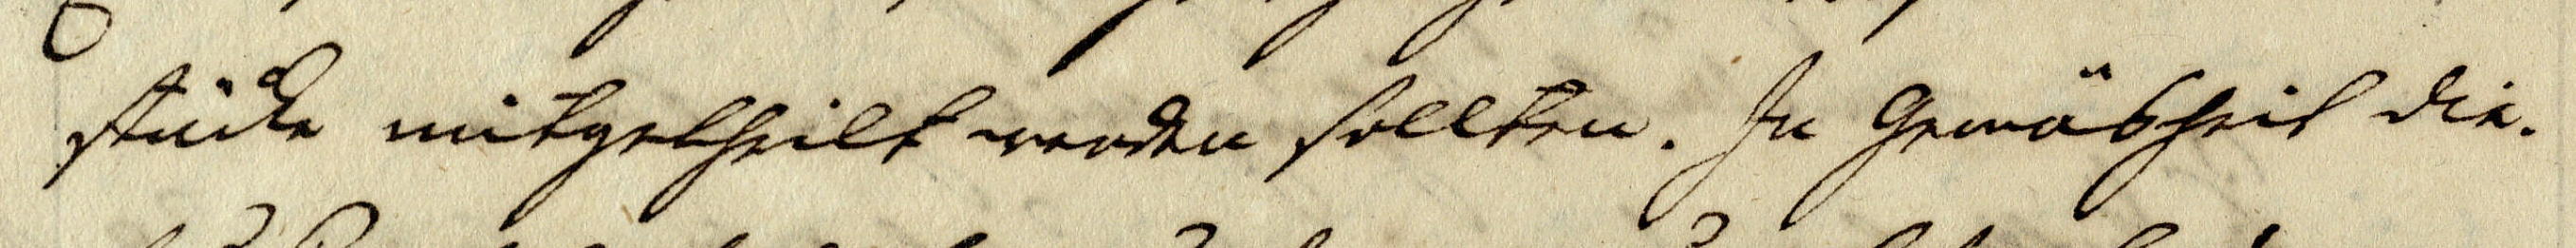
stücke mitgetheilt werden sollten. In Gemäsheit die¬
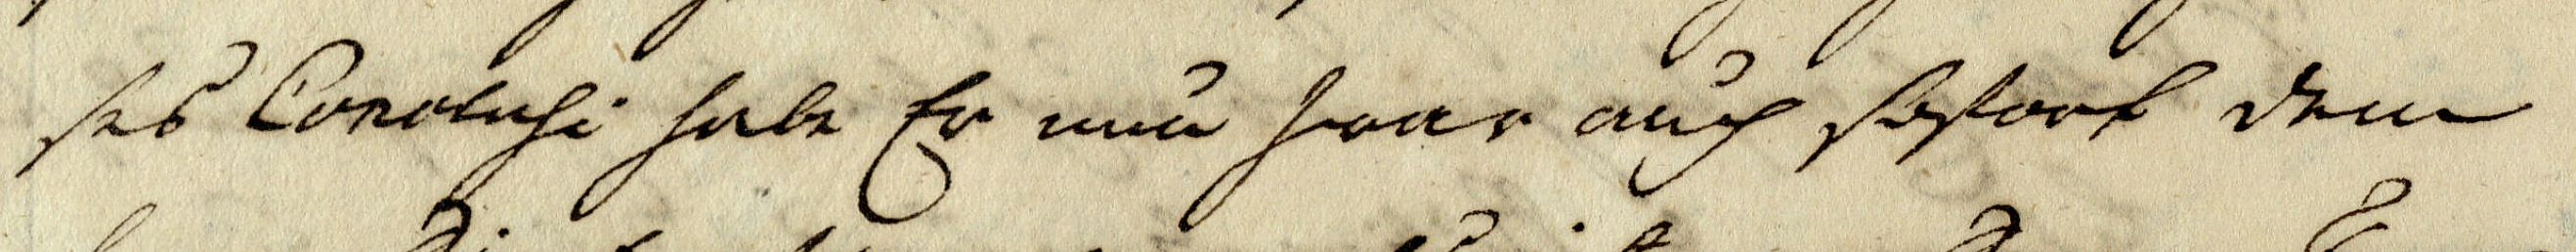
ses Conclusi habe Er nun zwar auch sofort dem
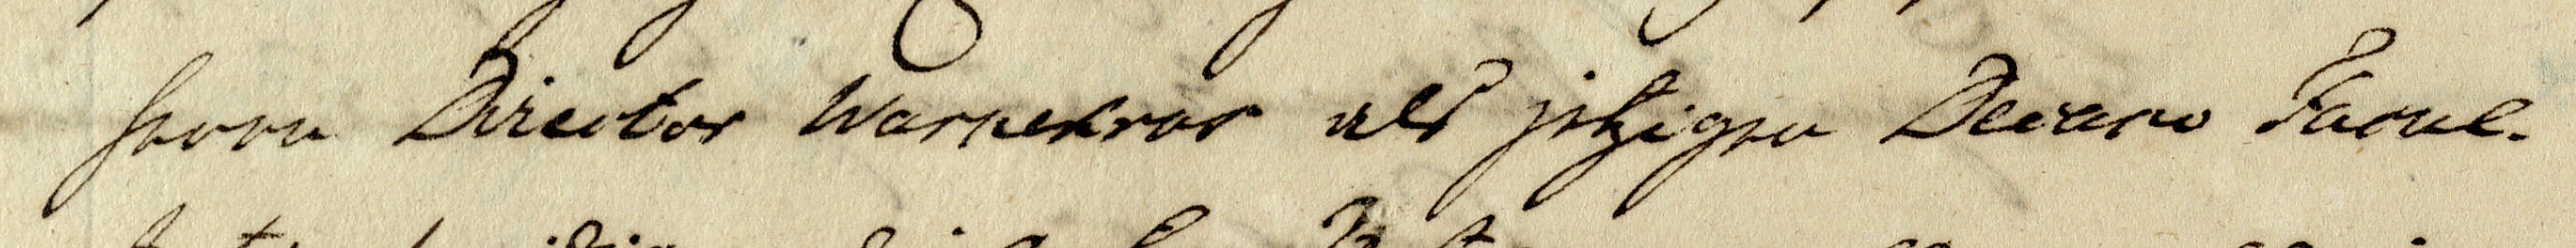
Herrn Director Warnekros als jetzigen Decano Facul¬
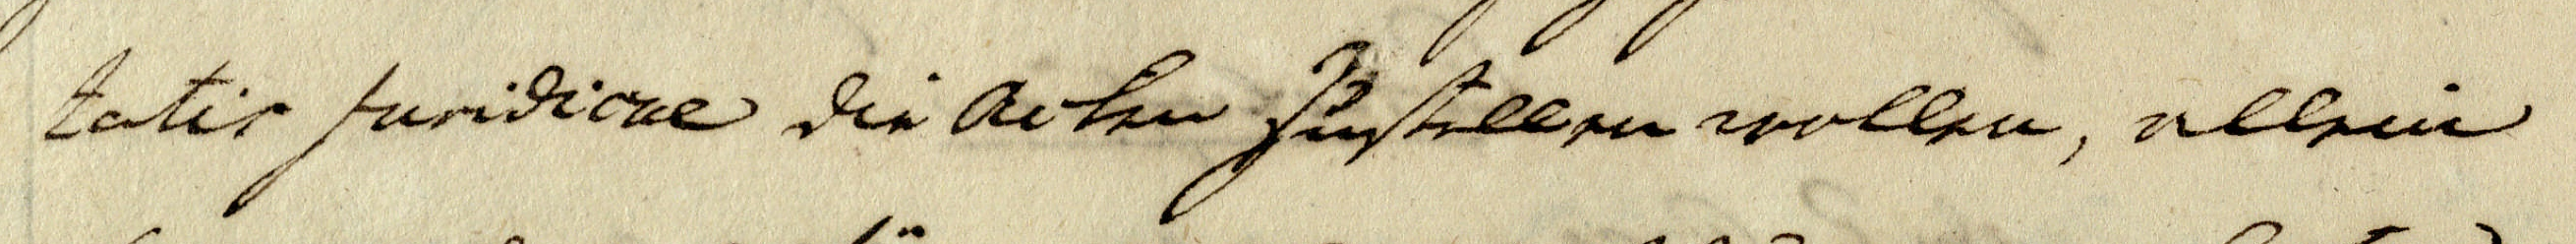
tatis Juridicae die Acten zustellen wollen, allein
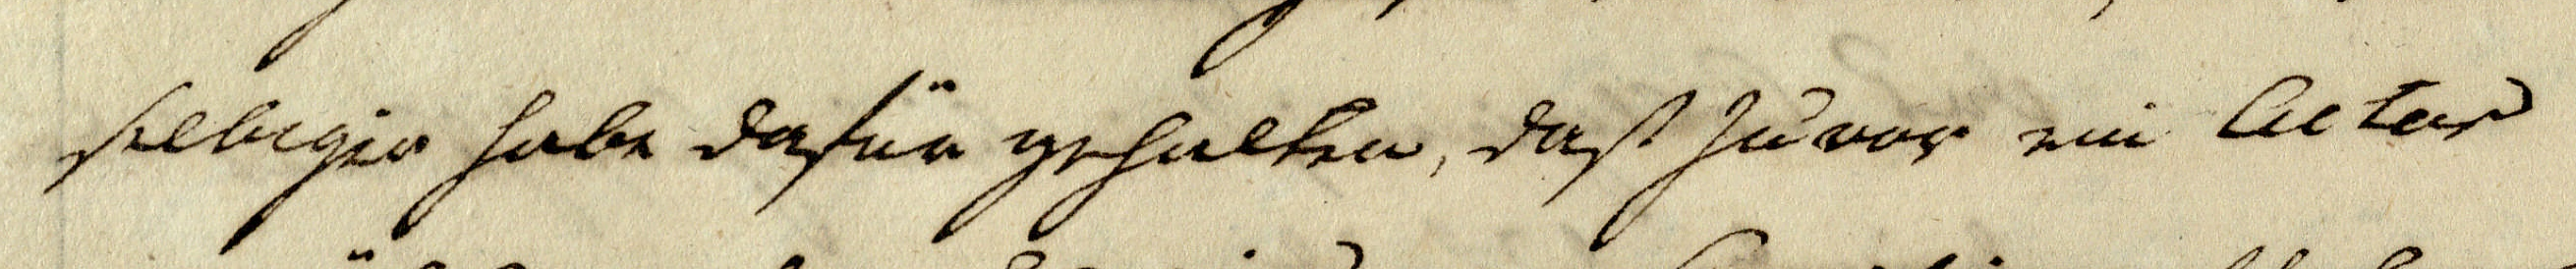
selbiger habe dafür gehalten, daß zu vor ein Actor
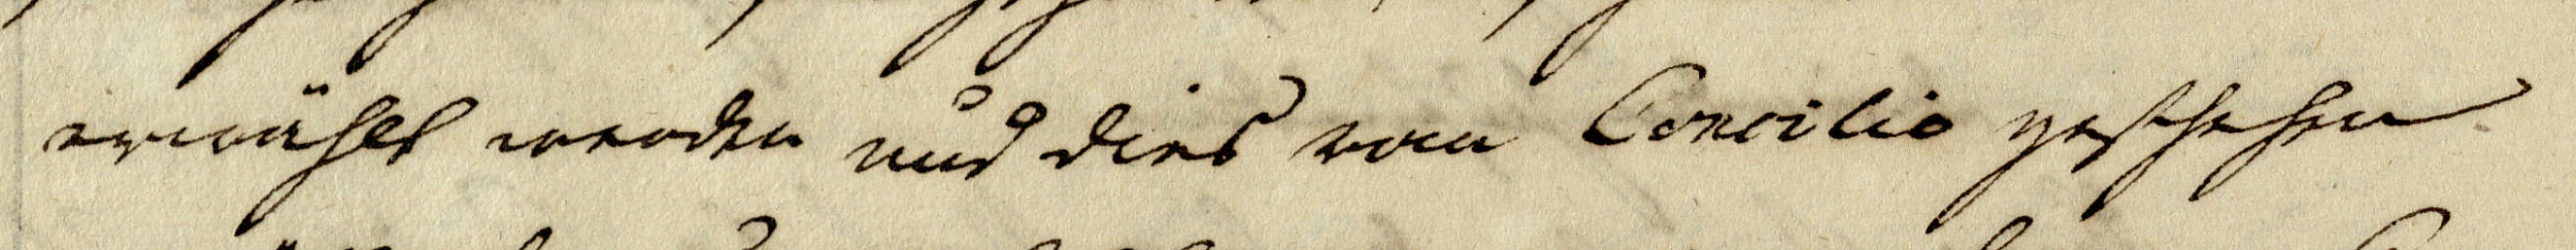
erwählt werden und dies vom Concilio geschehen
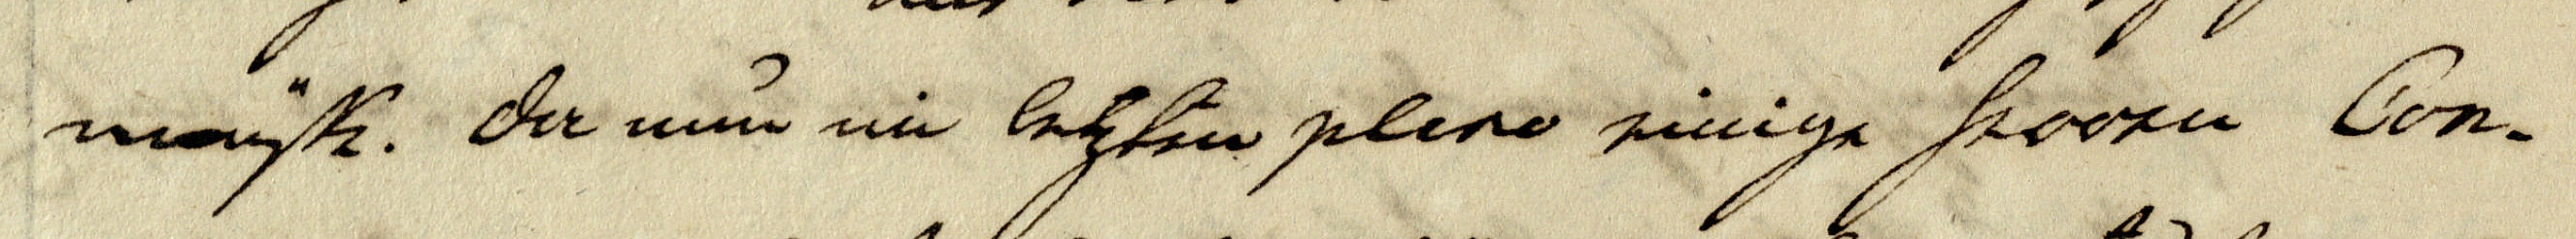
müsse. Da nun im letzten pleno einige Herren Con¬
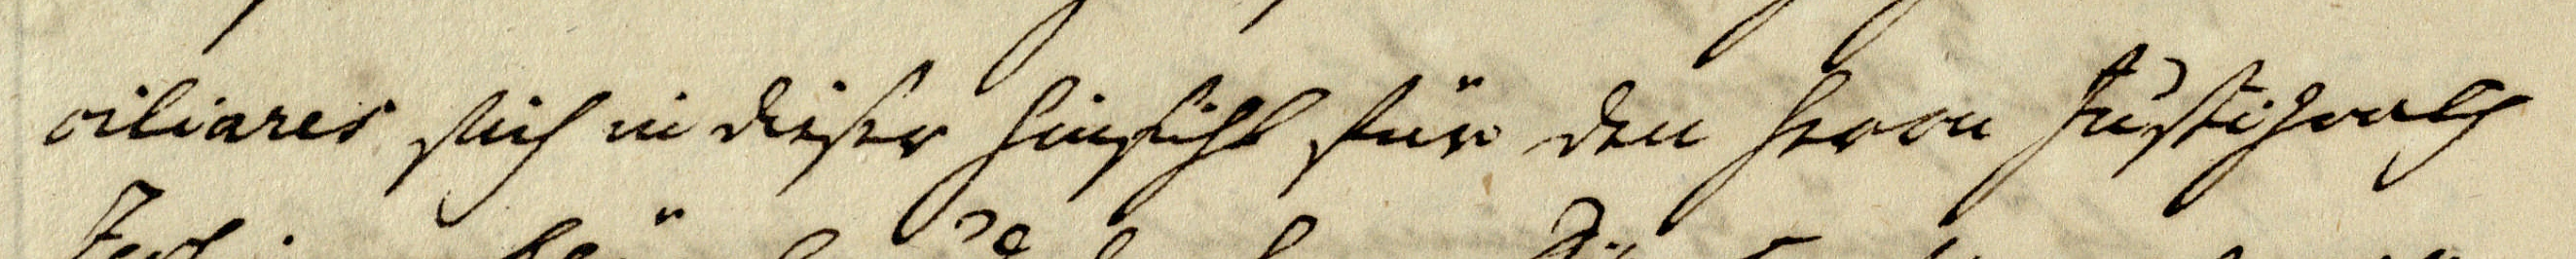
ciliares sich in dieser Hinsicht für den Herrn Justizrath
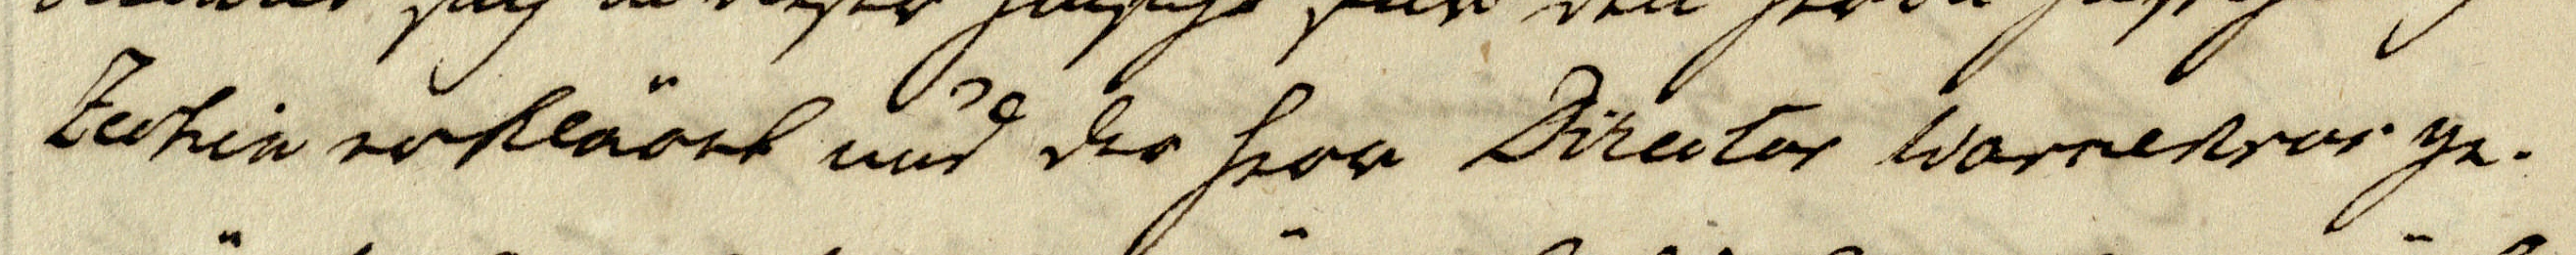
Zechin erkläret und der Herr Director Warnekros ge¬
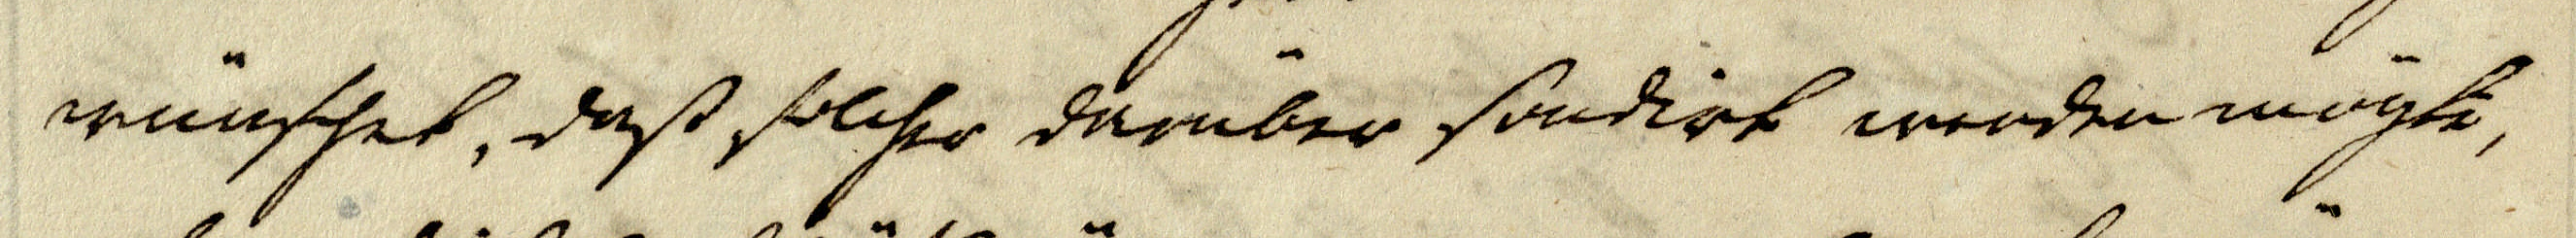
wünschet, daß solcher darüber sondirt werden mögte,
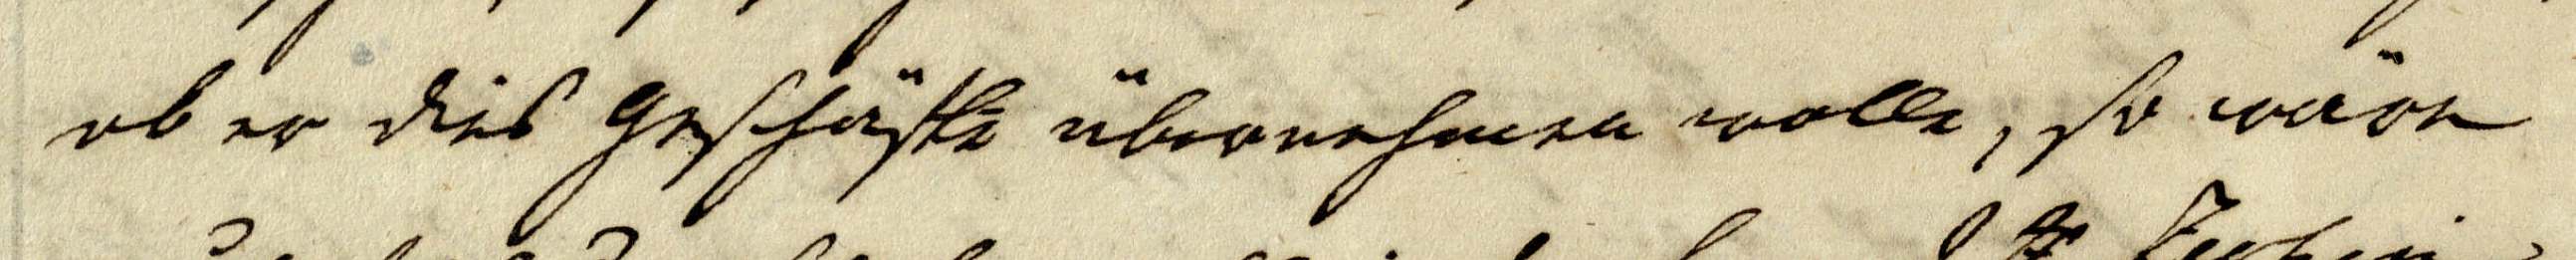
ob er dies Geschäfte übernehmen wolle, so wäre
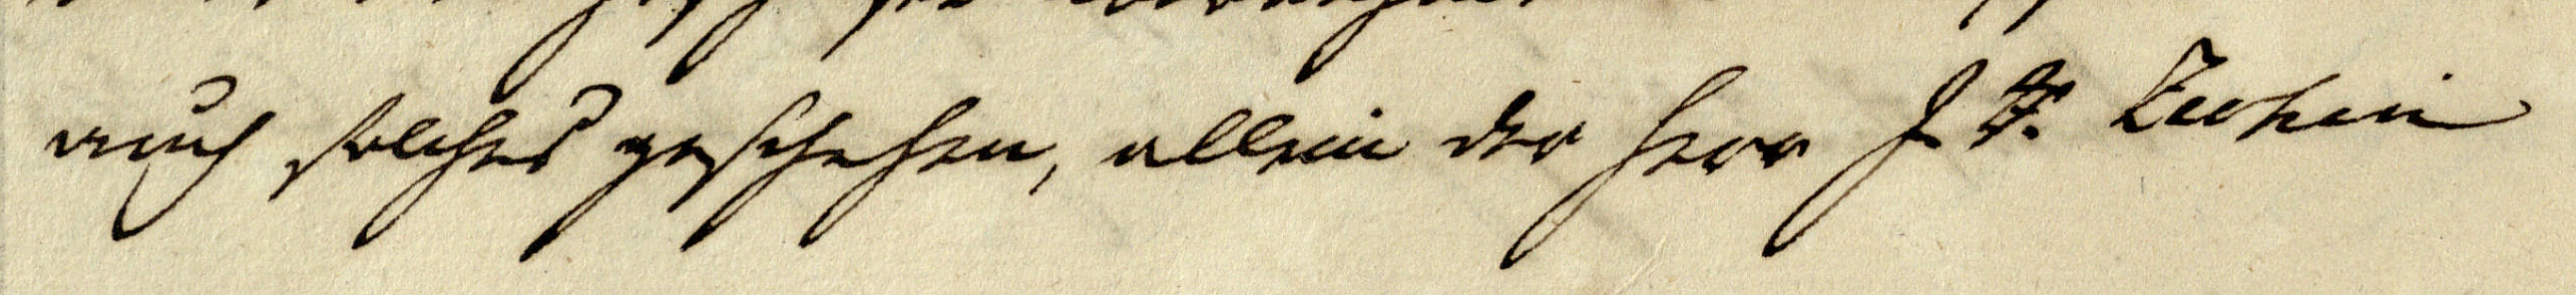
auch solches geschehen, allein der Herr J. R. Zechin
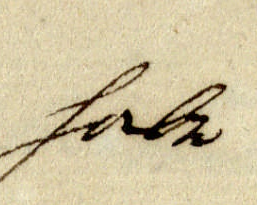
habe
